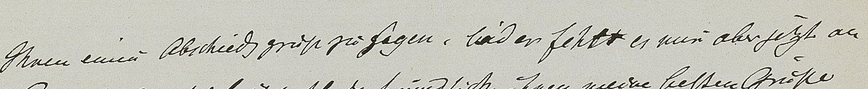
Ihnen einen Abschiedsgruss zu sagen, leider fehlt es mir aber jetzt an
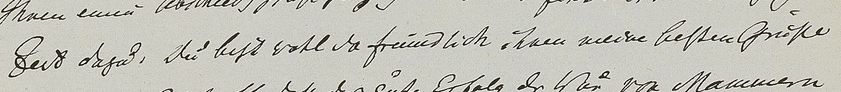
Zeit dazu, Du bist wohl so freundlich ihnen meine besten Grüsse
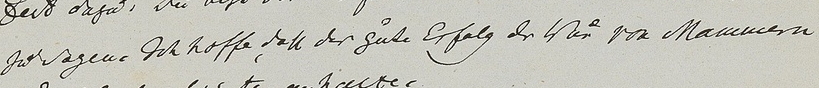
zu sagen. Ich hoffe, dass der gute Erfolg der Kur von Mammern
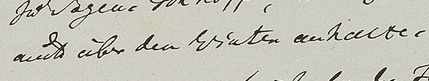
auch über den Winter anhalte.
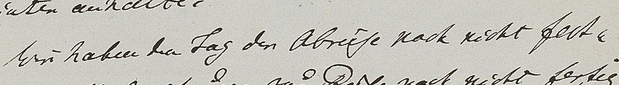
Wir haben den Tag der Abreise noch nicht fest-
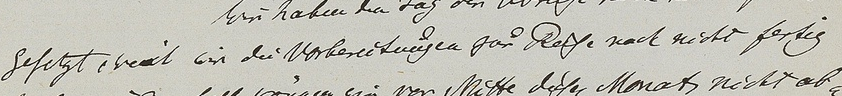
gesetzt, weil wir die Vorbereitungen zur Reise noch nicht fertig
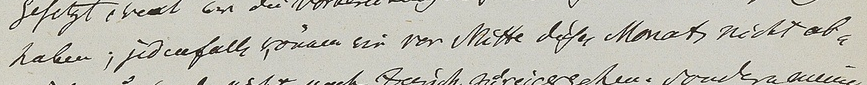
haben; jedenfalls können wir vor Mitte dieses Monats nicht ab-
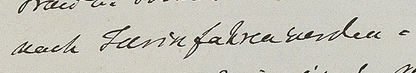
nach Turin fahren werden.
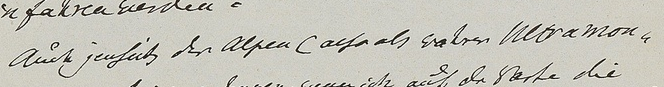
Auch jenseits der Alpen (also als wahrer Ultramon-
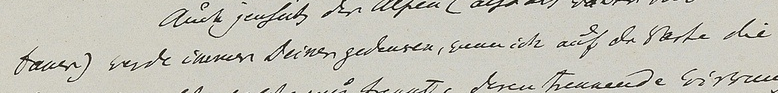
taner) werde immer Deiner gedenken, wenn ich auf der Karte die
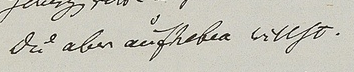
Du aber aufheben willst.
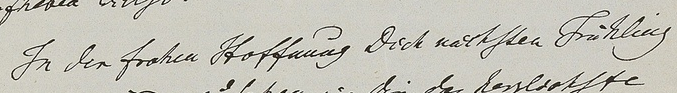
In der frohen Hoffnung Dich nächsten Frühling
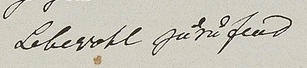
Lebewohl zurufend
